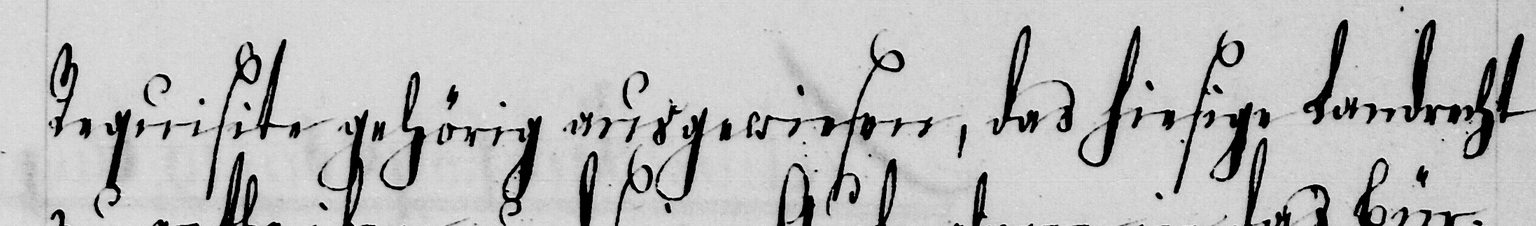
Requisite gehörig ausgewiesen, das hiesige Landrecht
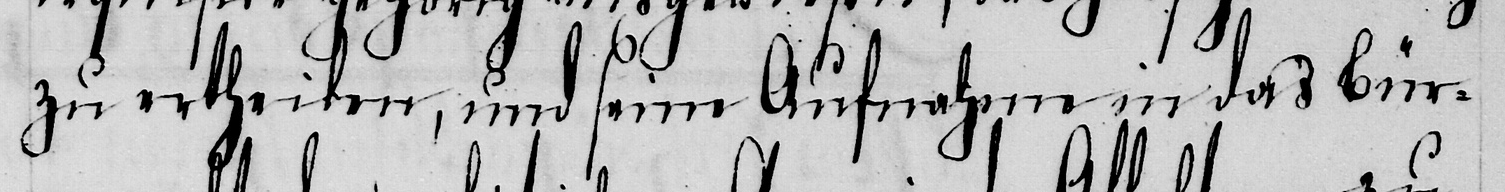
zu ertheilen, und seine Aufnahme in das Bür¬
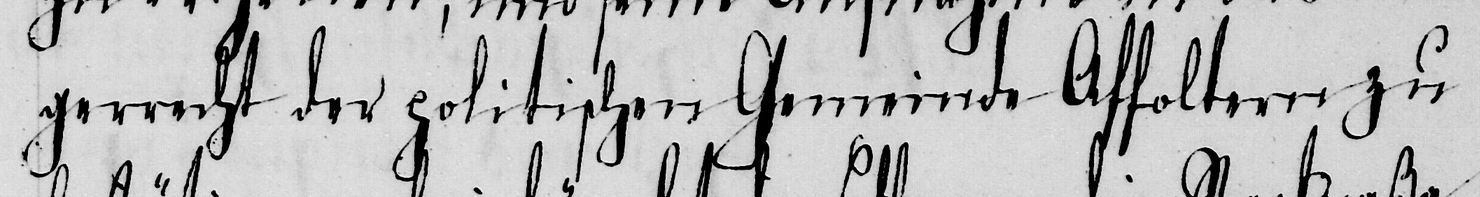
gerrecht der politischen Gemeinde Affoltern zu
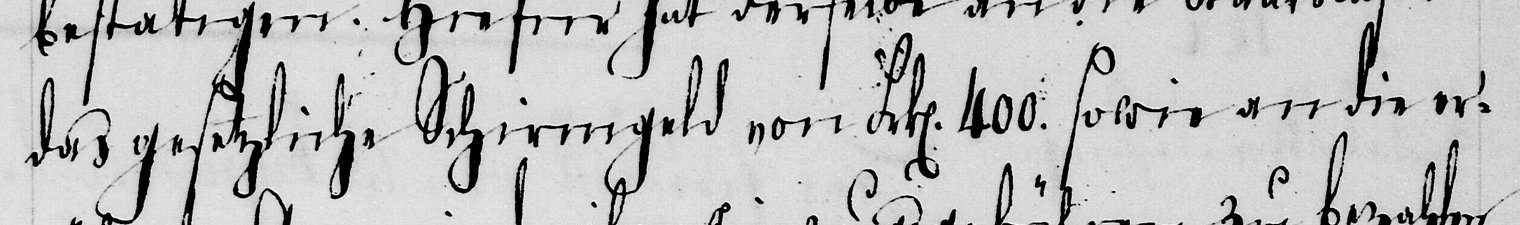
das gesetzliche Schirmgeld von Frk[en]. 400. sowie an die er¬
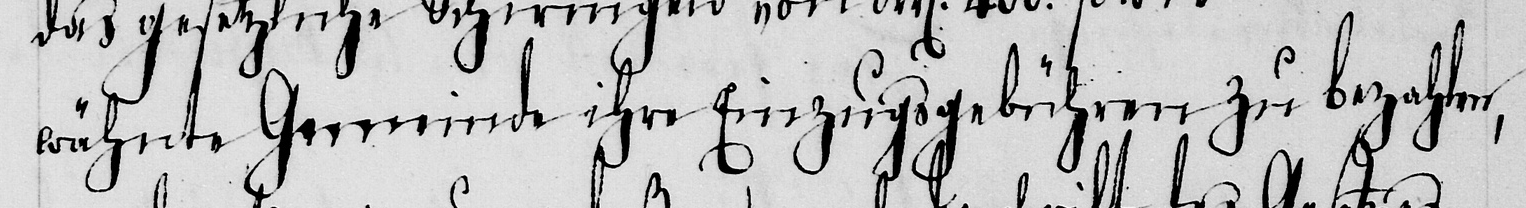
wähnte Gemeinde ihre Einzugsgebühren zu bezahlen,
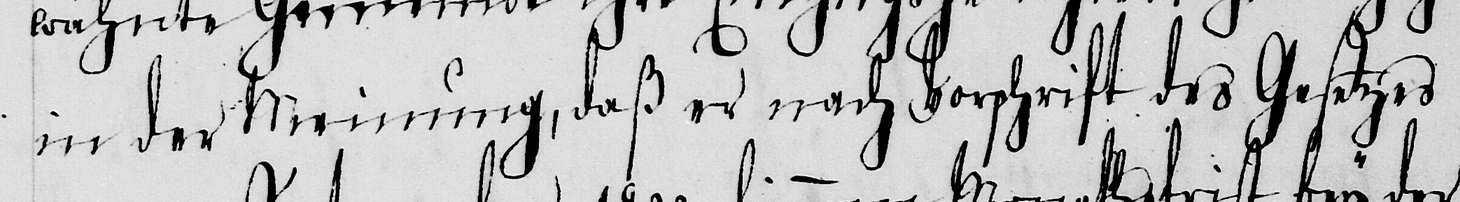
in der Meinung, daß er nach Vorschrift des Gesetzes
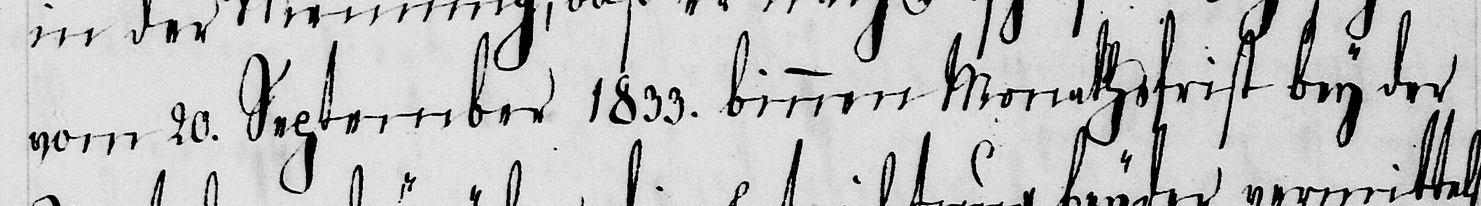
vom 20. September 1833. binnen Monathsfrist bey der
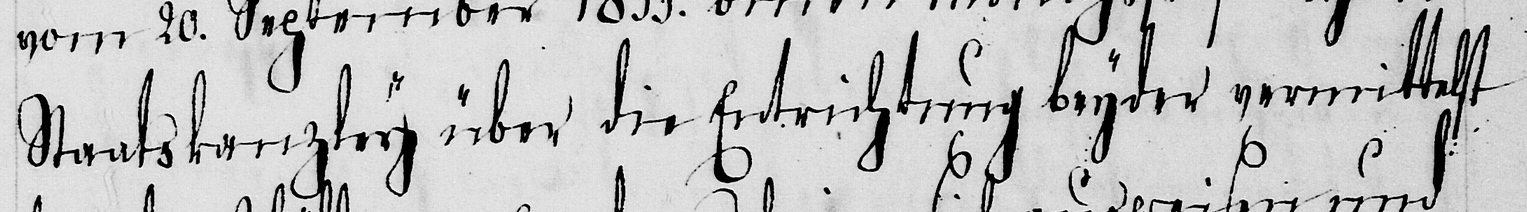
Staatskanzley über die Entrichtung beyder vermittelst
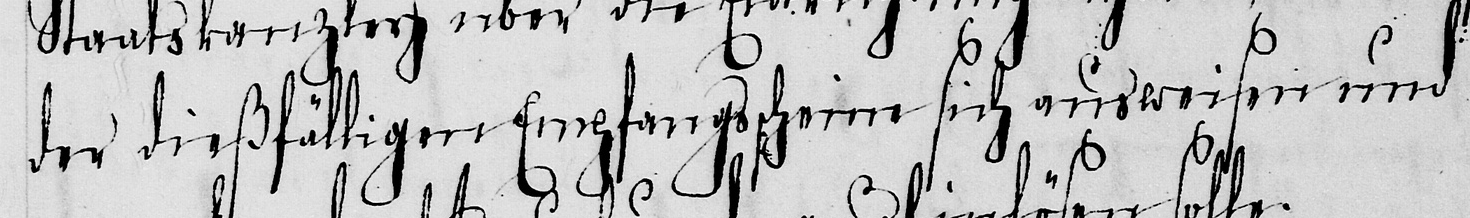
der dießfälligen Empfangsscheine sich ausweisen und
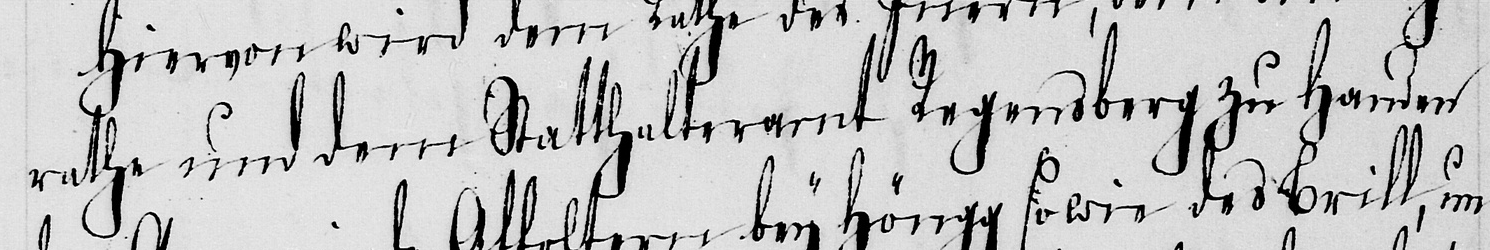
rathe und dem Statthalteramt Regensberg zu Handen
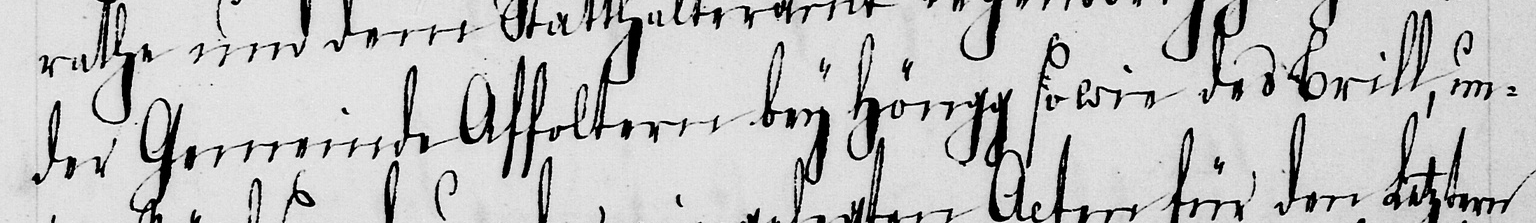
der Gemeinde Affoltern bey Höngg sowie des Brill, un¬
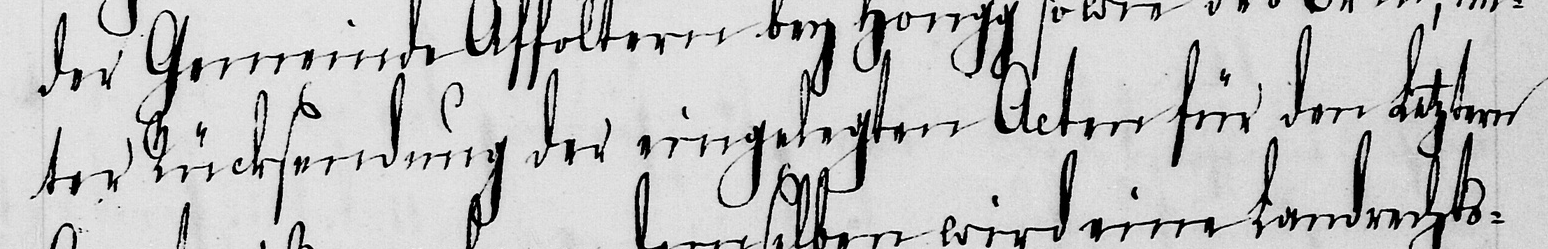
ter Rücksendung der eingelegten Acten für den Letztern
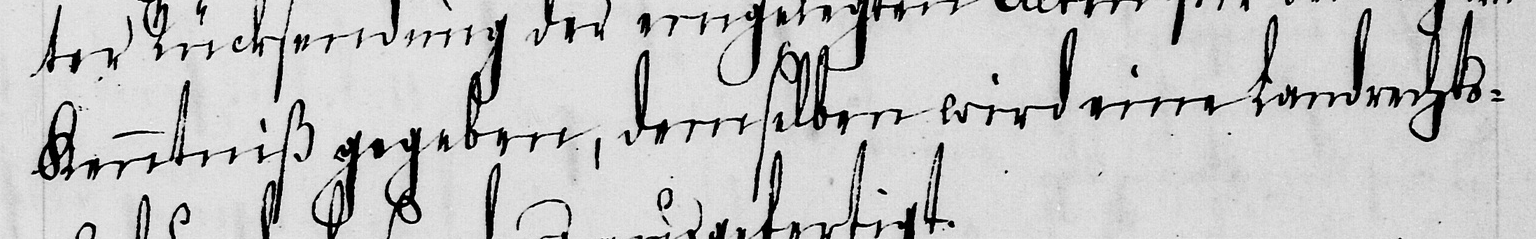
Kenntniß gegeben, demselben wird eine Landrechts¬
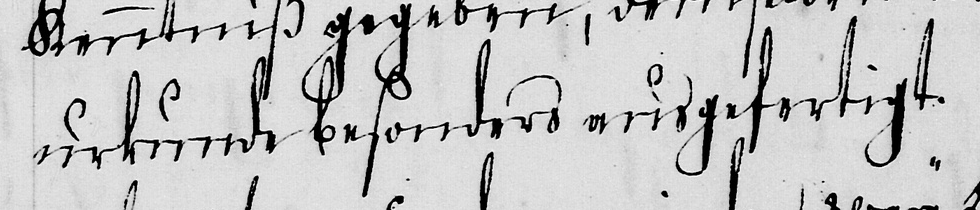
urkunde besonders ausgefertigt.
